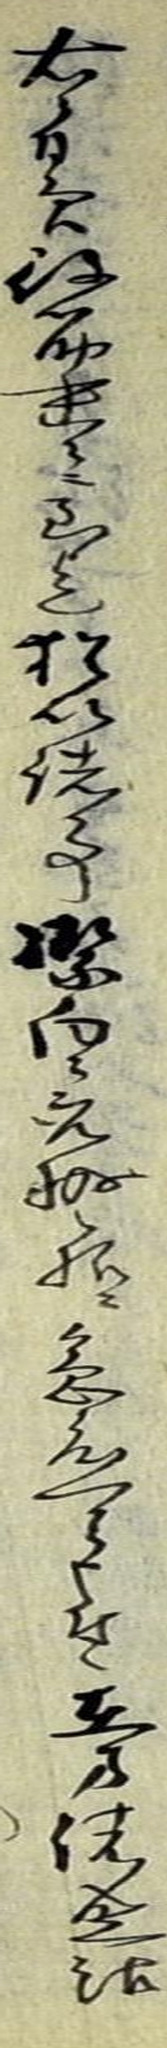右に付而は役筋末々に至迄猶以諸事潔白に取扱候様に急度可被申付候在方諸盛銀
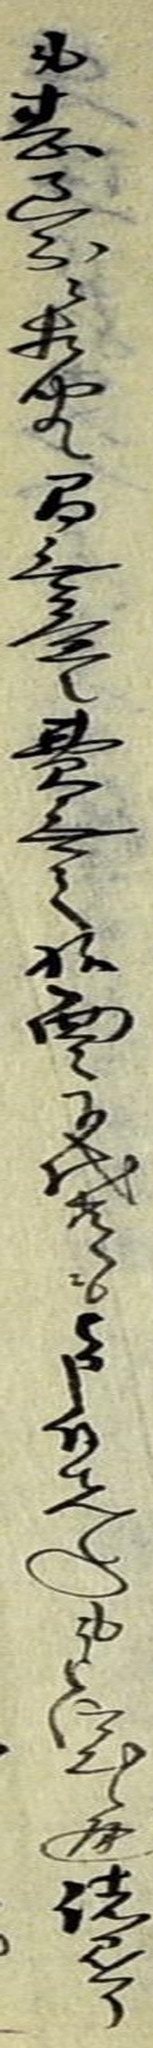も甚過分に相聞候間無益之費無之様面々下代共へも被申付先年も被仰出候通諸懸り
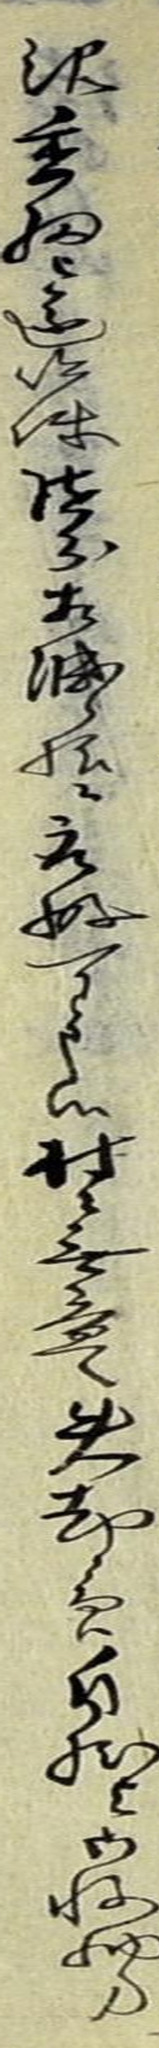銀委細被遂吟味随分相減候様に取扱可被申候村々無益之失却に而は自然と御収納方
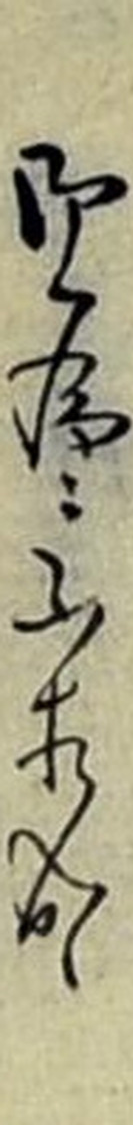御為に不相成候
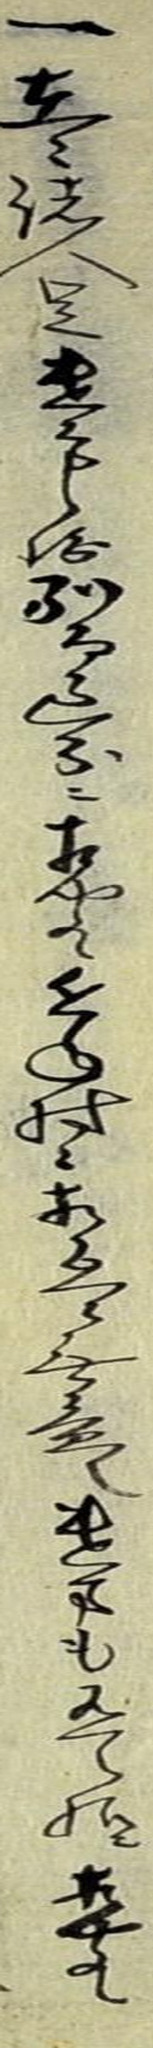一在々諸人足遣方之儀別而過分に相聞候近年村々相互に無益之遣方も有之様に相聞候
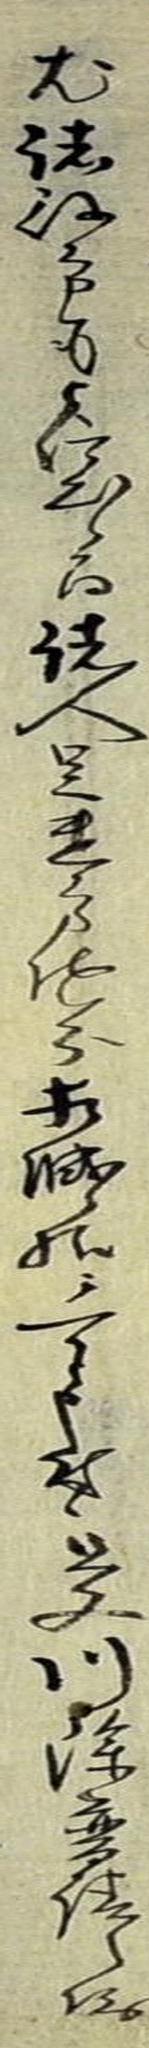尤諸役方も被仰出候間諸人足遣方随分相減候様に可被申付候且又川除普請之儀
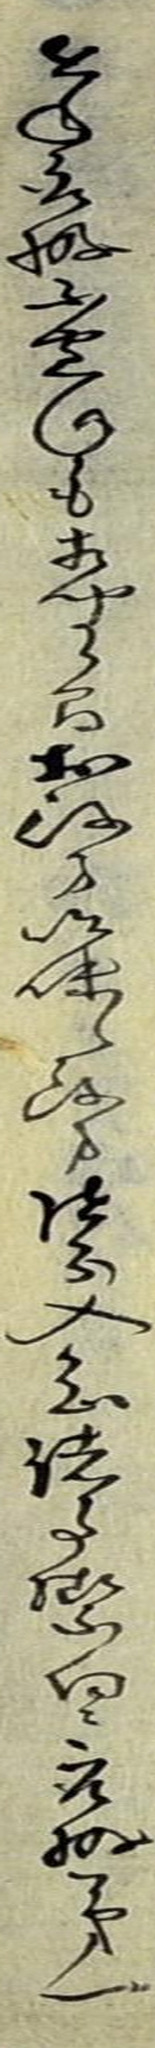近年取扱不宜趣も相聞候間於役方吟味之致方随分入念諸事潔白に取扱第一
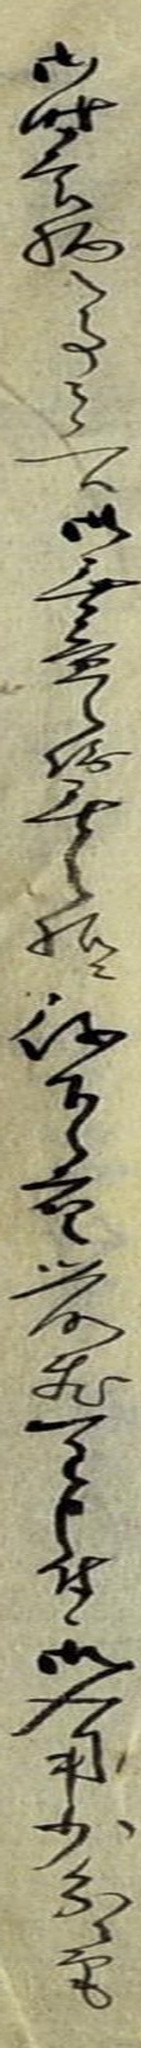御時節柄之事に候へは御無益之儀無之様に役下之者へ厳敷可被申付候御入用少分に而も
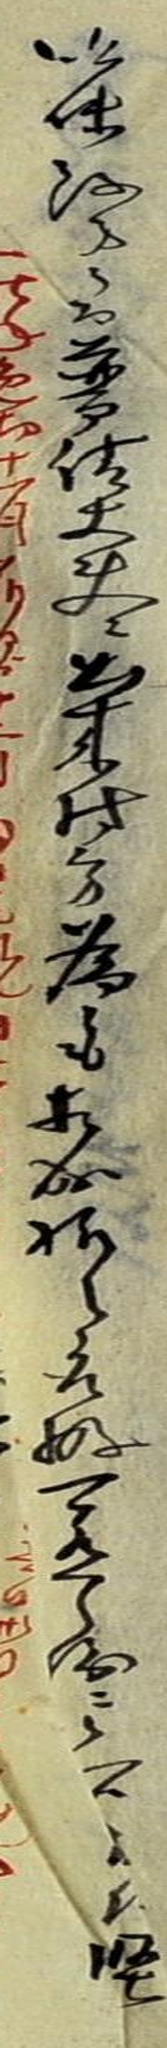御吟味役方に而普請丈夫に出来村方為にも相成様之取扱可有之儀に候へは此儀堅
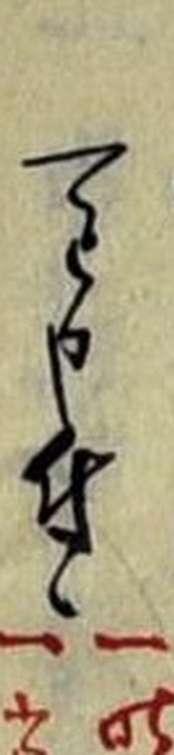可被申談候
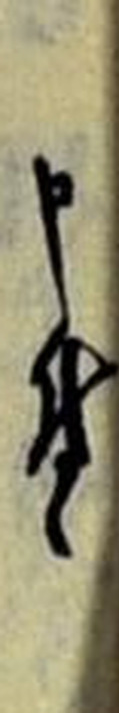申付候
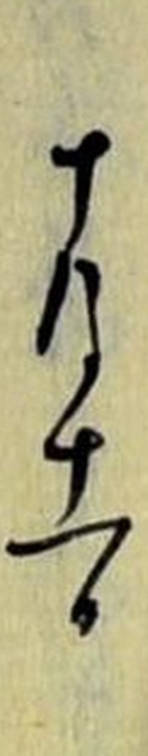十月十一日
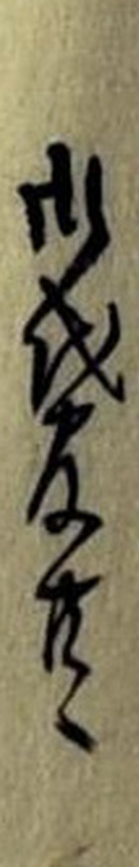御代官共へ
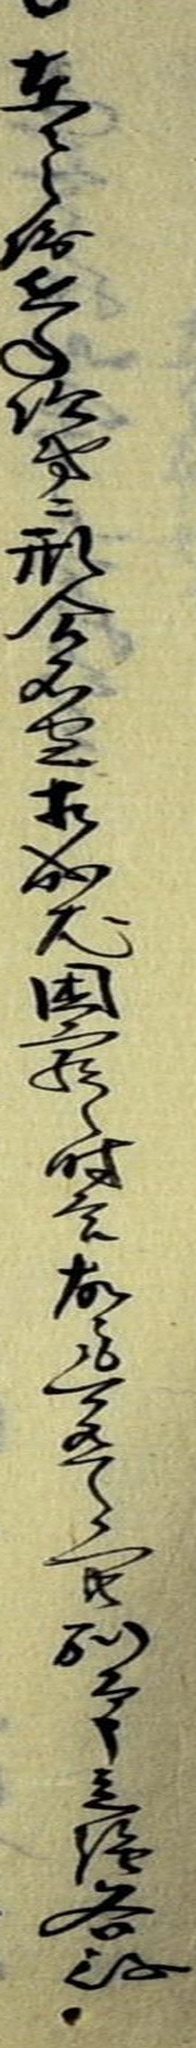〇在々之儀近年次第に形合不宜相成尤困窮之時節故にも可有之候へ共別而申立強各役
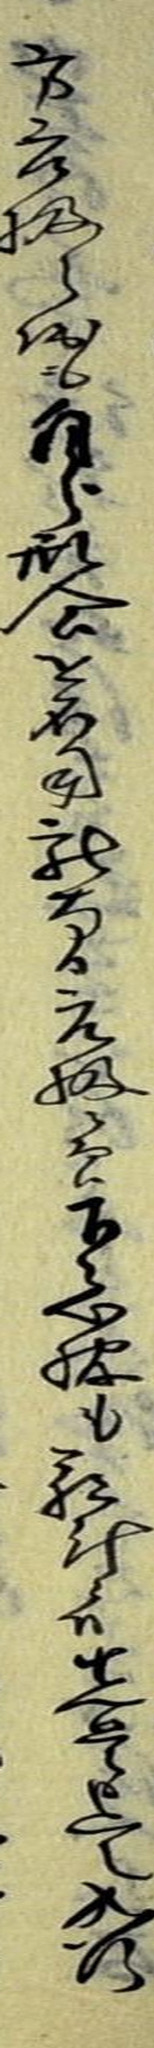方取扱之儀も自ら形合を不用新なる取扱に而は下々心服も難計に付先是迄之成行
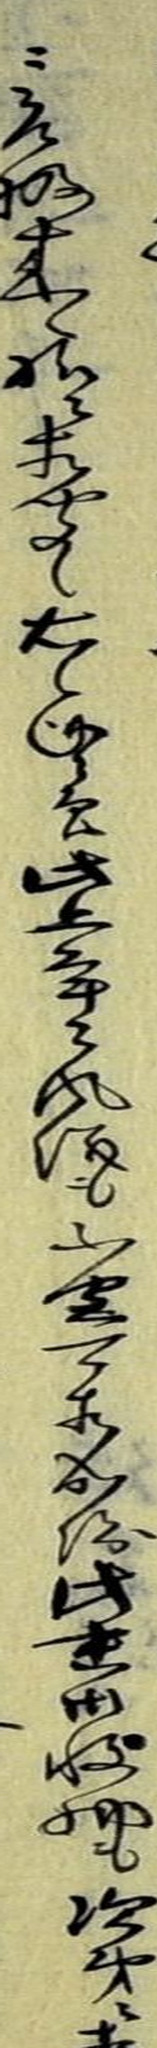に取扱来候様に相聞候右之趣に而は此上年々風儀も不宜可相成儀此末御収納も次第に相
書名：命令之部 二
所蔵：福井県文書館 Fukui Prefectural Archives
